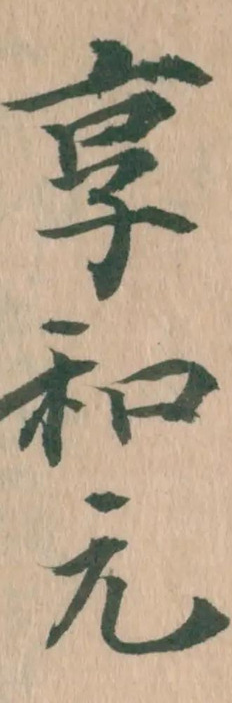享和元
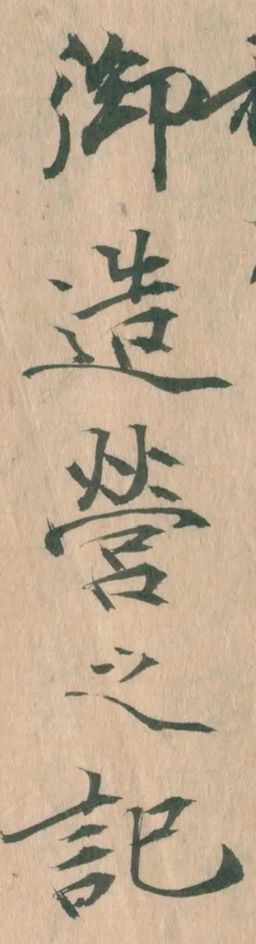御造営之記

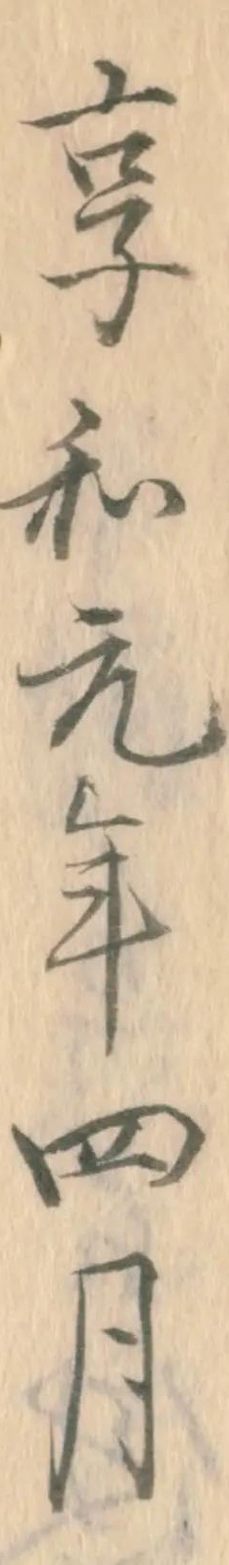享和元年四月
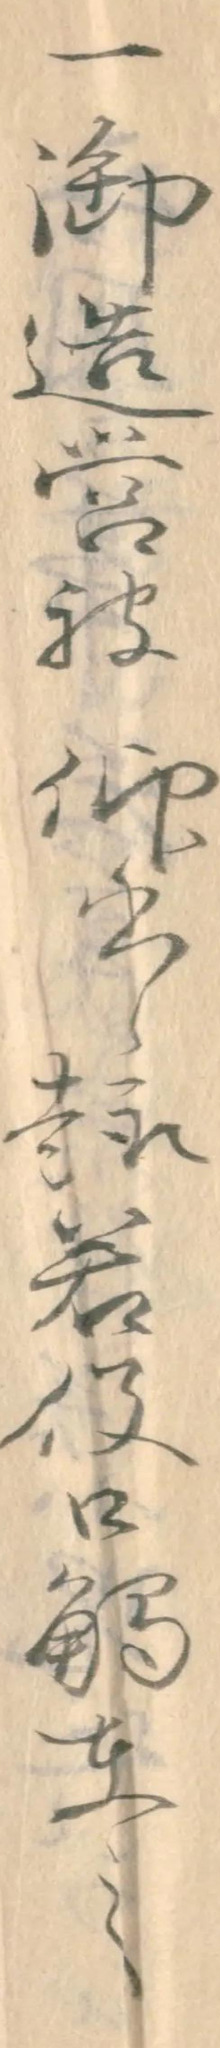一御造営被仰出候趣若役口触在之
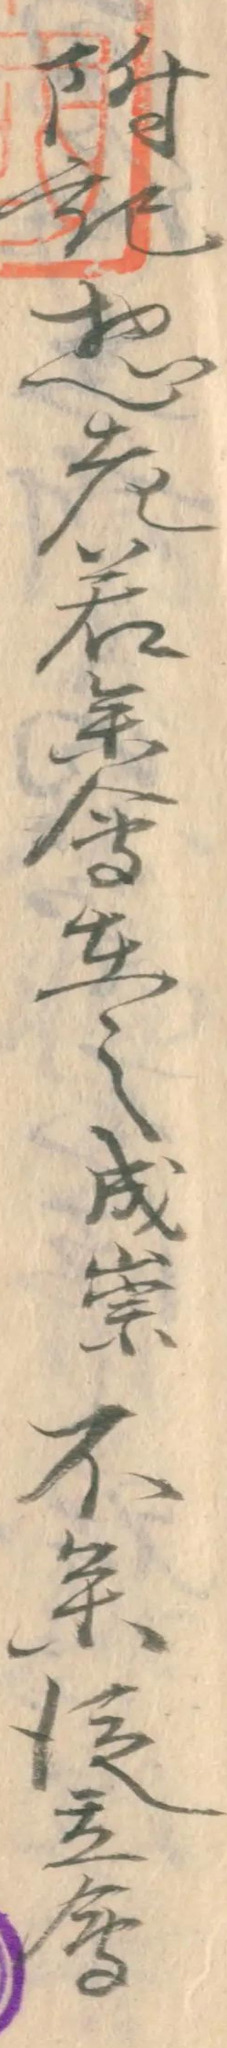附記惣老若参会在之成崇不参従立会
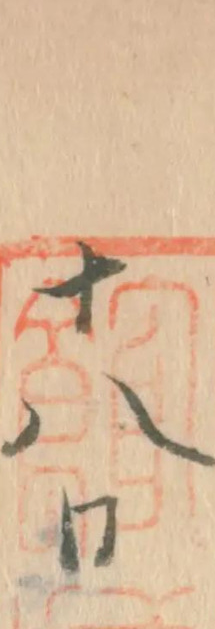十八日
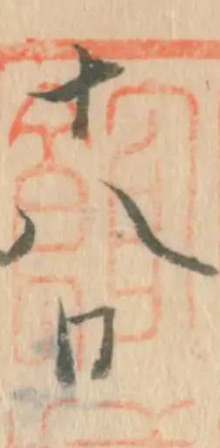十八日
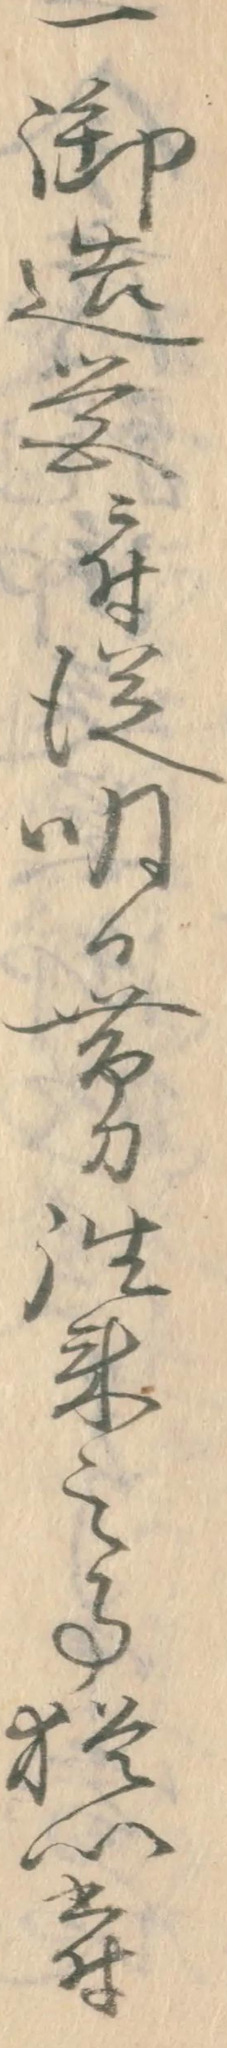一御造営に付従明日帯刀往来之事猶以書付
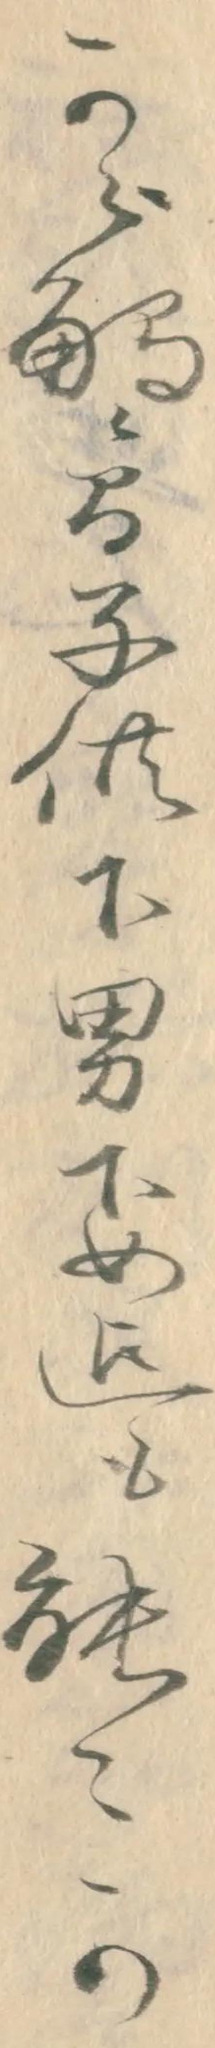可被触候間子供下男下女迄も能々可
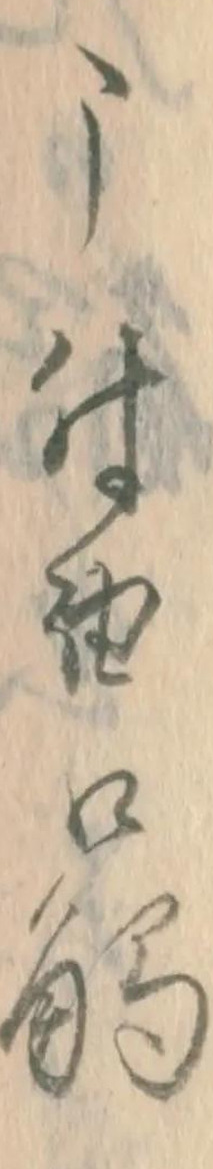申付由口触

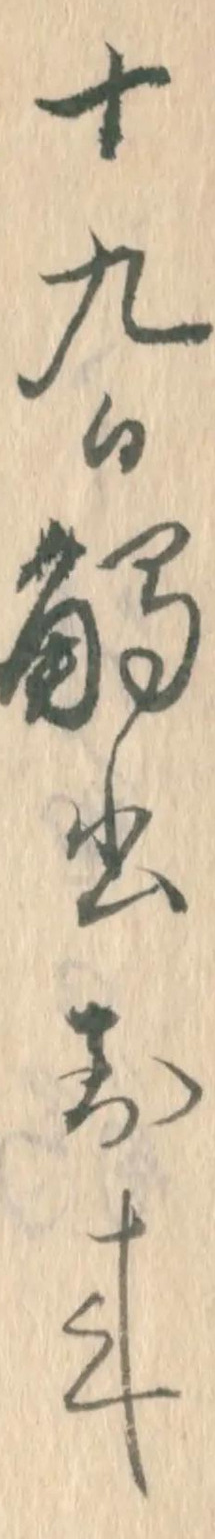十九日触書到来
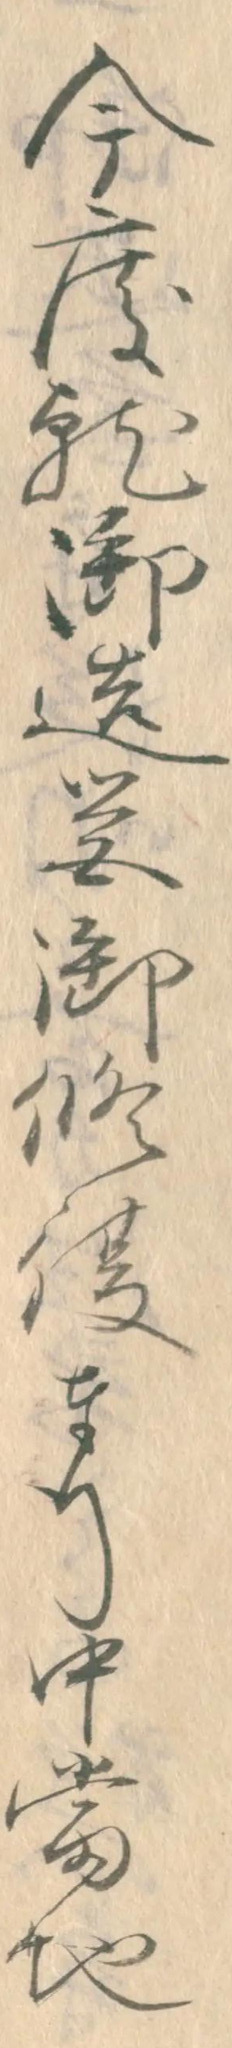一今度就御造営御修復奉行中当地
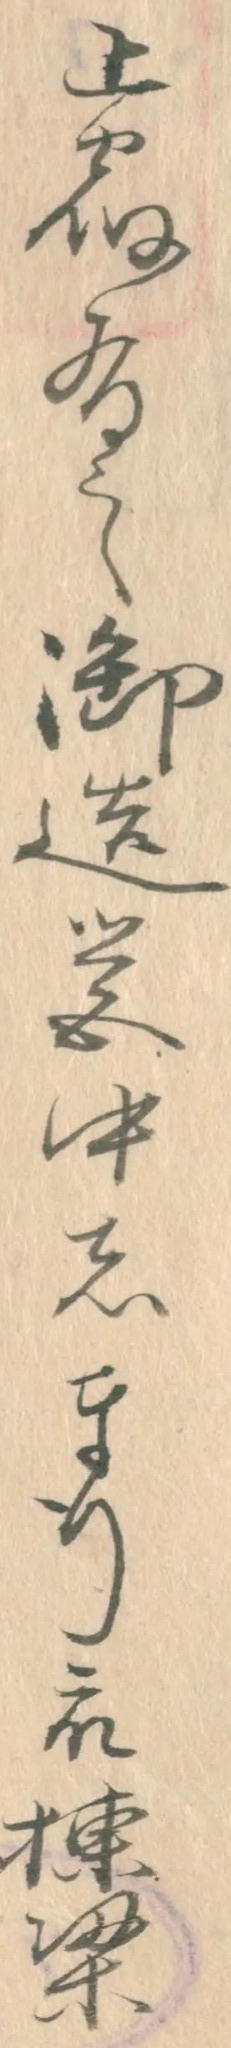止宿有之御造営中は奉行衆棟梁
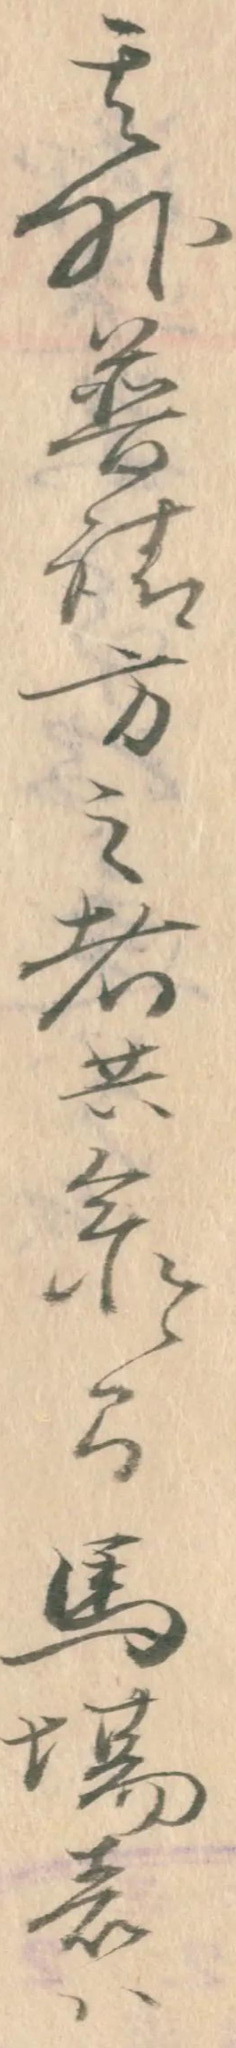其外普請方之者共参候間馬場表は
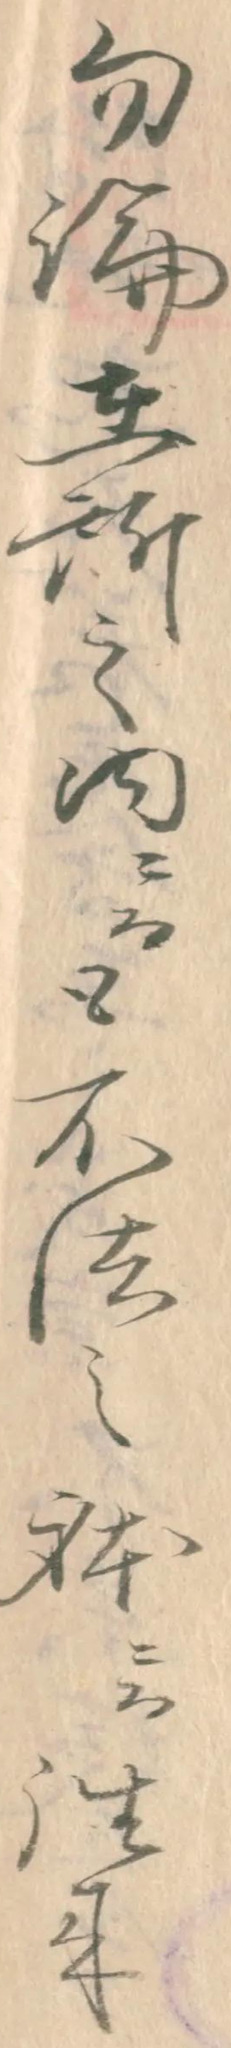勿論在所之内に而も不法之躰に而往来
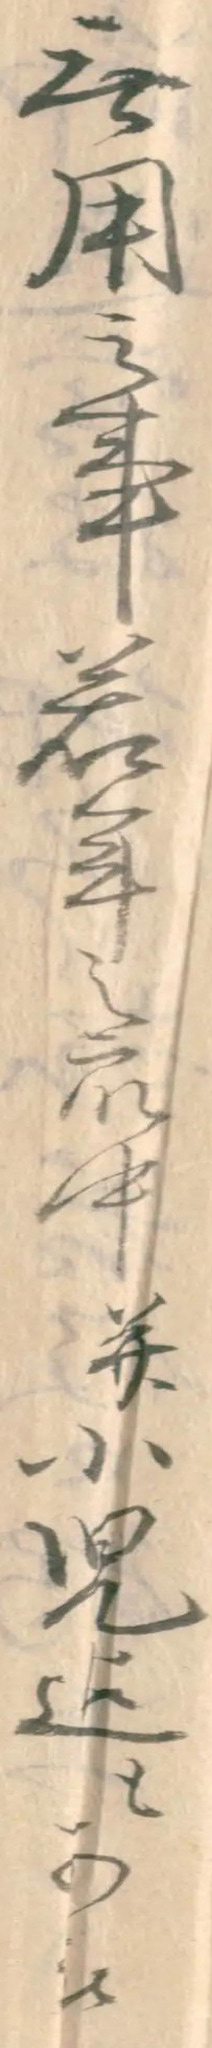無用之事若年之衆中并小児迄も可被
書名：賀茂社記録. 第22冊
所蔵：国立国会図書館 National Diet Library, JAPAN
